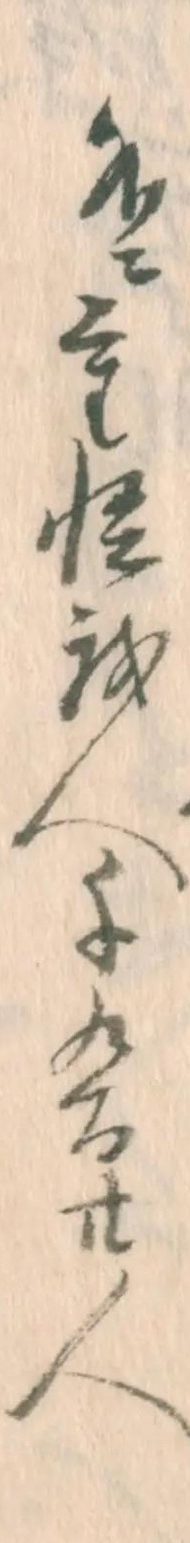外ニ重怪我人千九百廿人
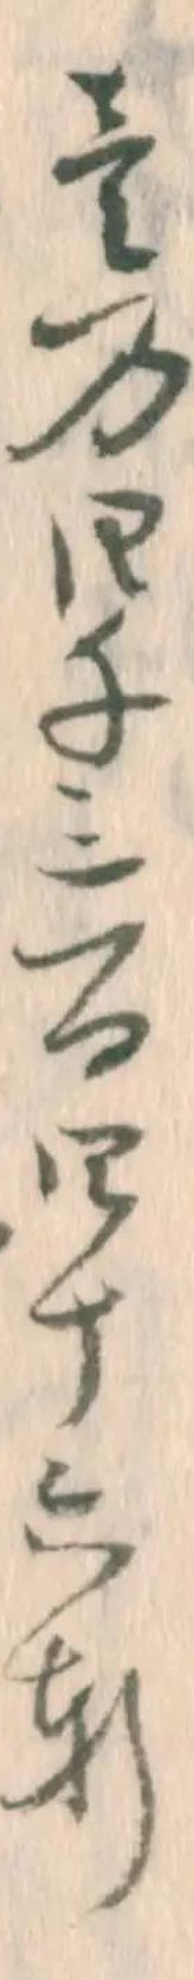壱万四千三百四十六軒
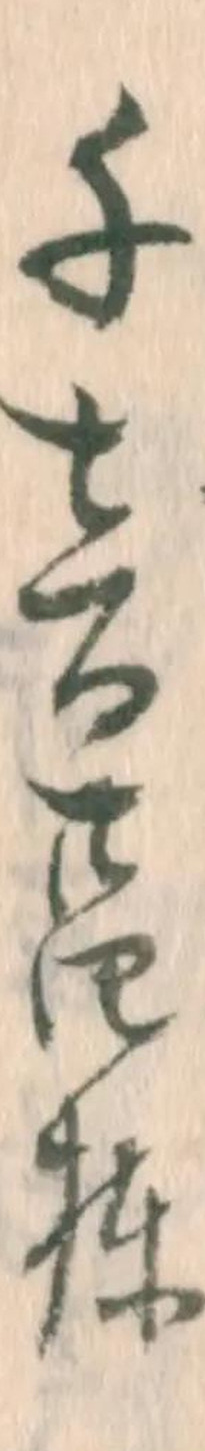千七百廿四棟
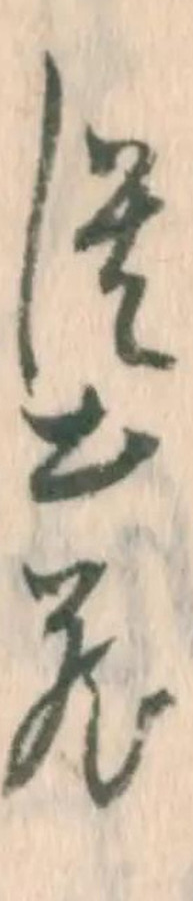潰土蔵
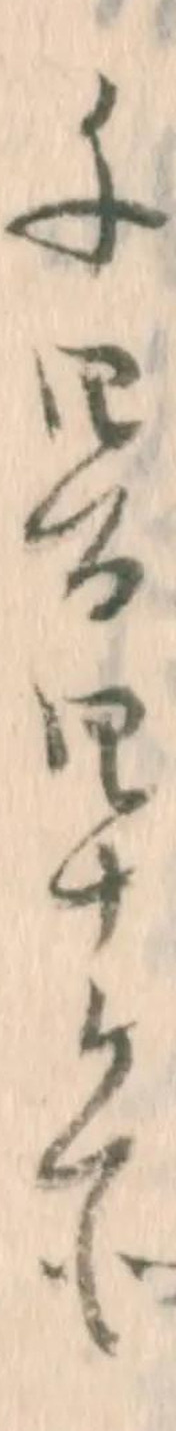千四百四十ケ所
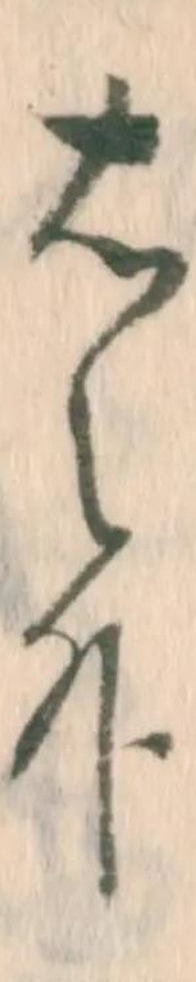右之外
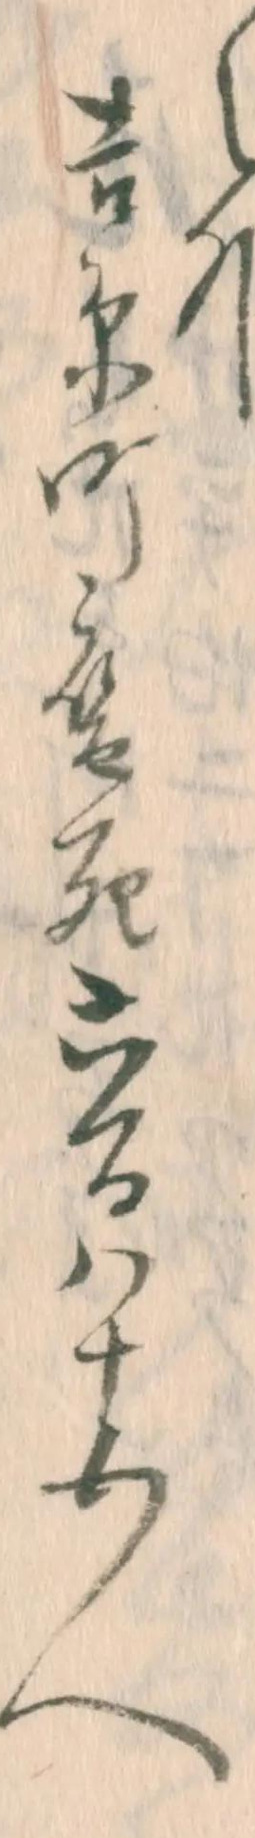吉原町変死六百八十五人
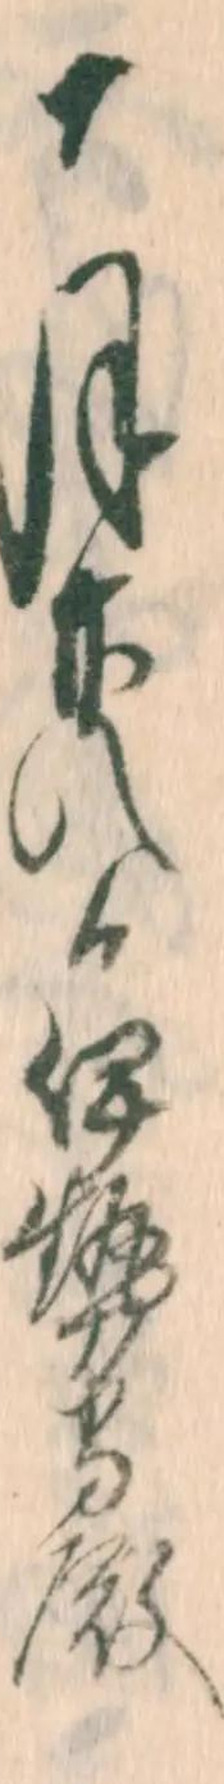十月廿八日伊勢守殿
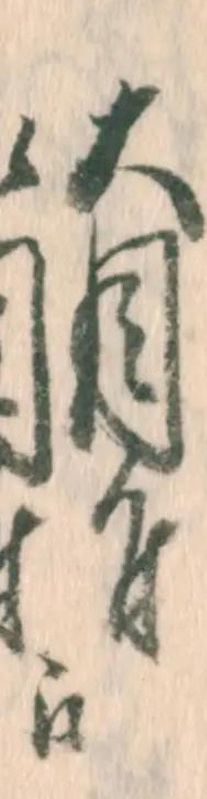大目付え
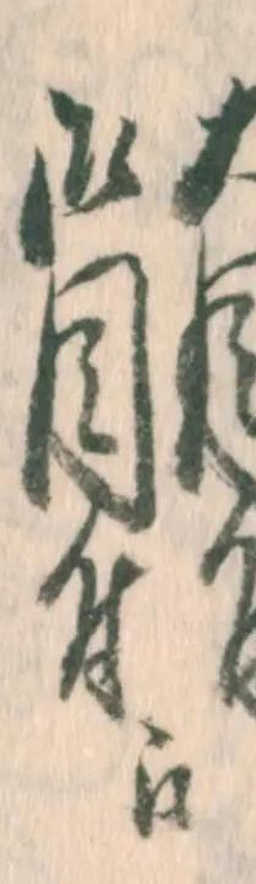大目付え
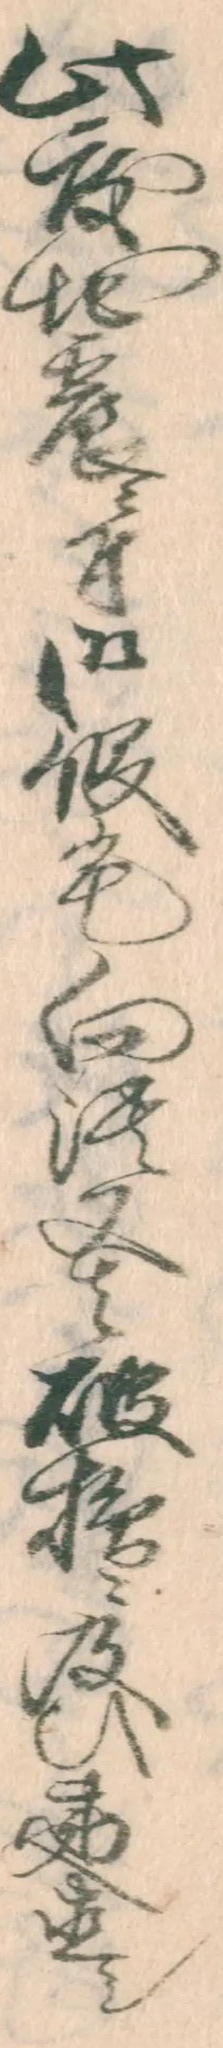此度地震ニ付御役宅向潰又は破損ニ及ひ建直シ
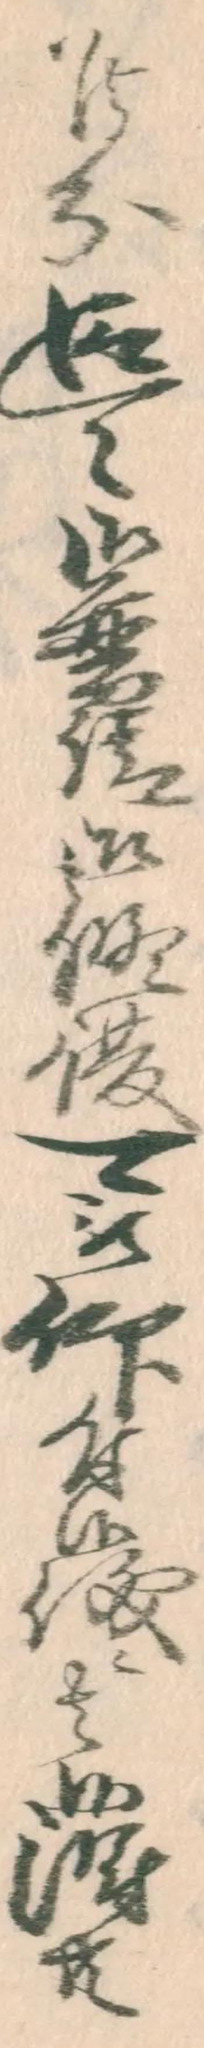候分追々御普請御修復可被仰付候儀ニは候得共
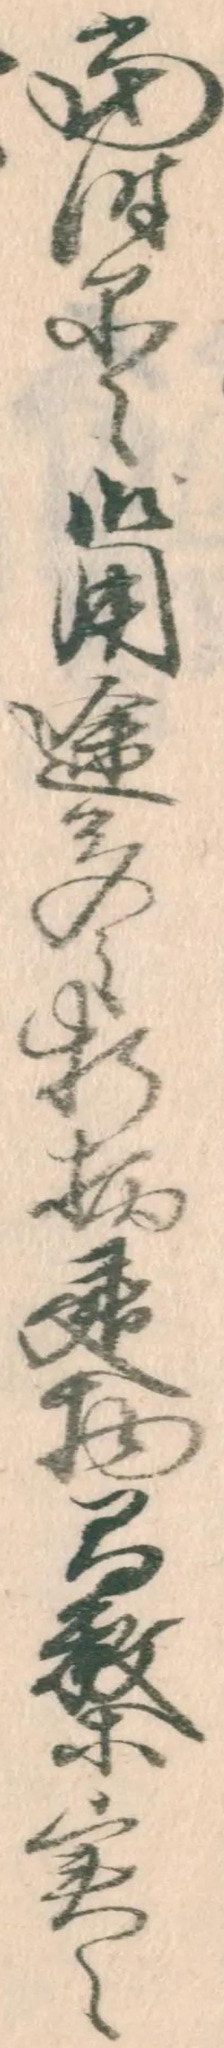当時品々御用途多之折柄建物間数等実々
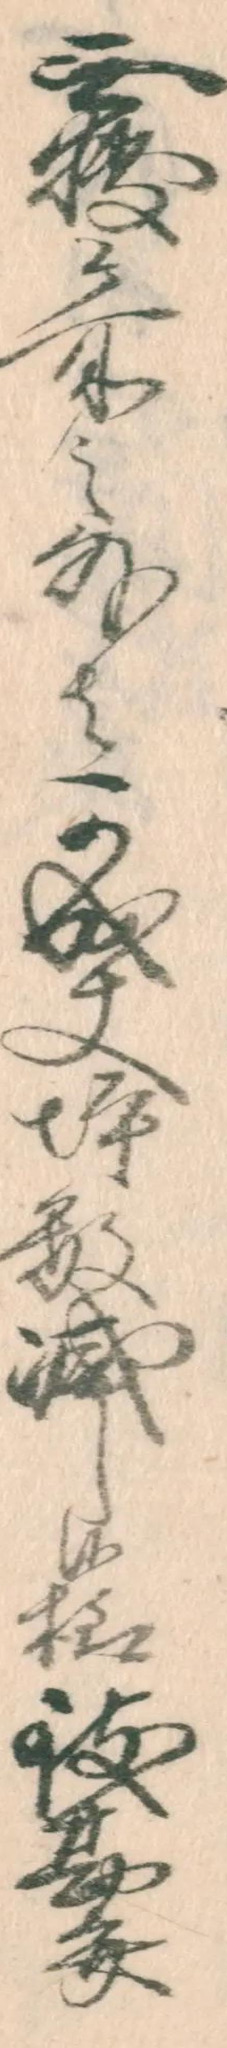無拠ケ所之外は可成丈坪数減し候様致勘弁
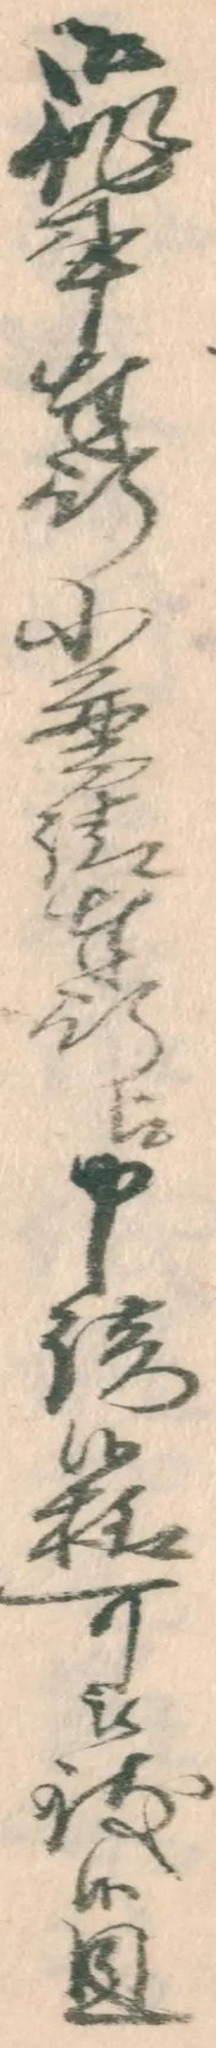御作事奉行小普請奉行え申談候様可被致候且
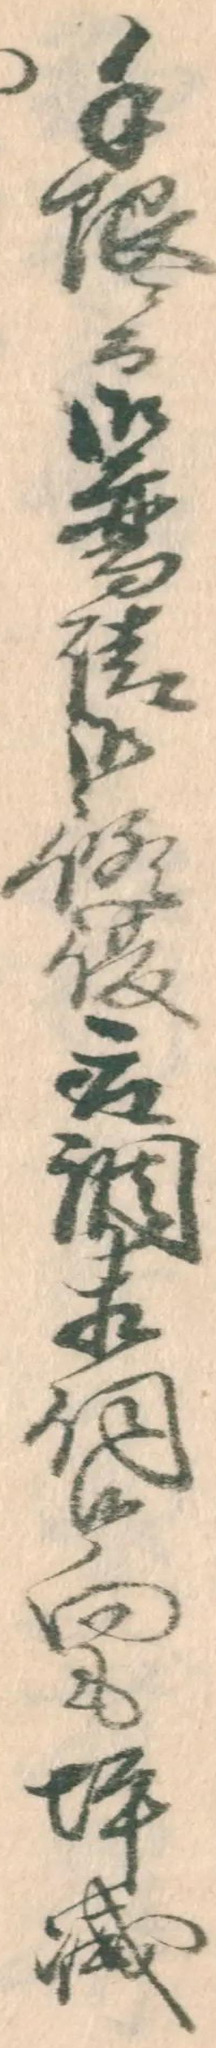手限ニ而御普請御修復取調相伺候向も坪減
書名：地震災書留 2巻. [1] 内表紙に「地震災書留　安政二卯年　但本所深川御用屋敷地代免除調」とあり
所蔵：国立国会図書館 National Diet Library, JAPAN
